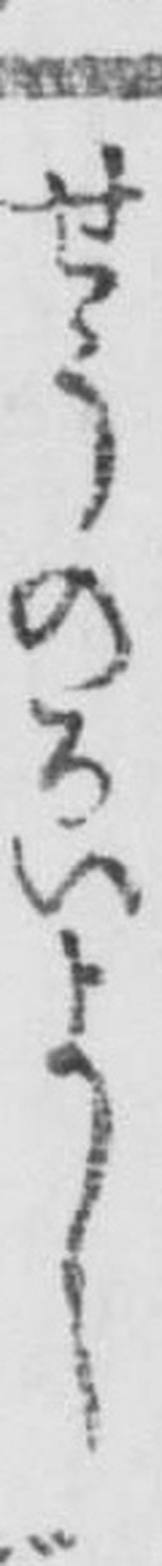せうのるいよし
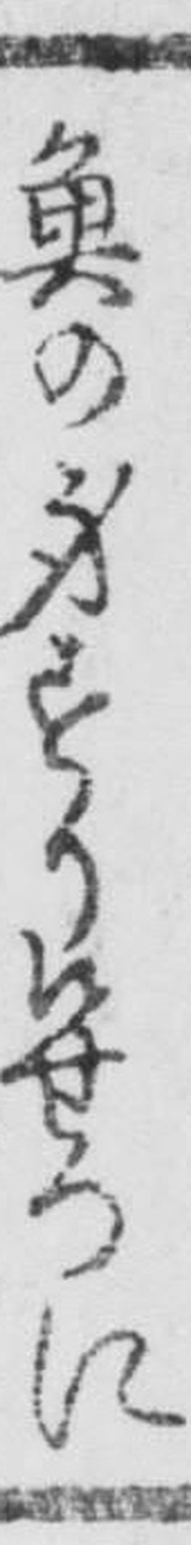魚の身すり候せつに
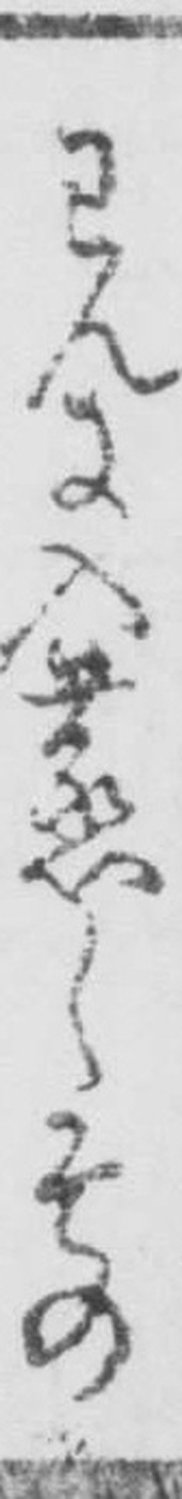わんに入蒸しその
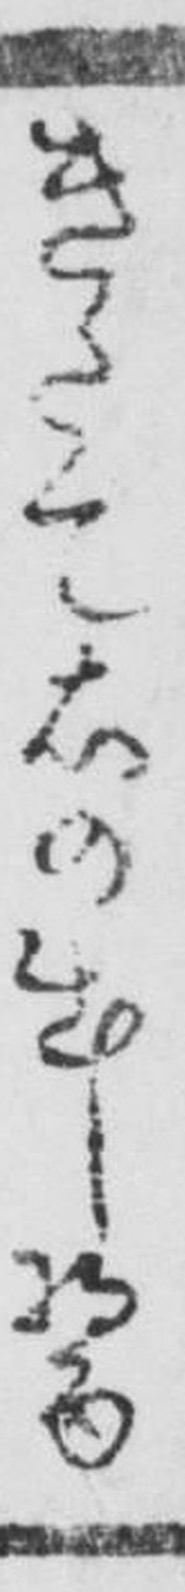きたて右の出し醤
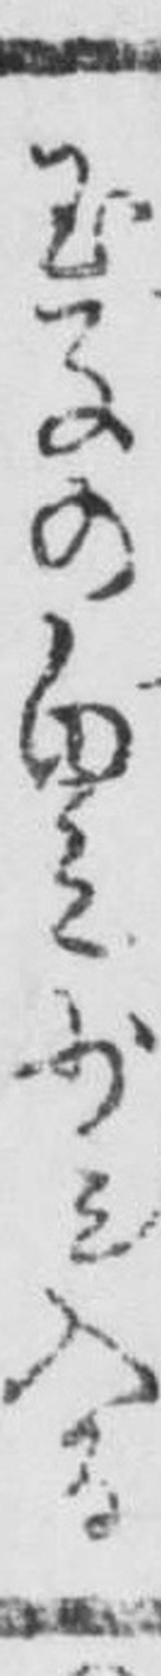玉子の白み少し入る
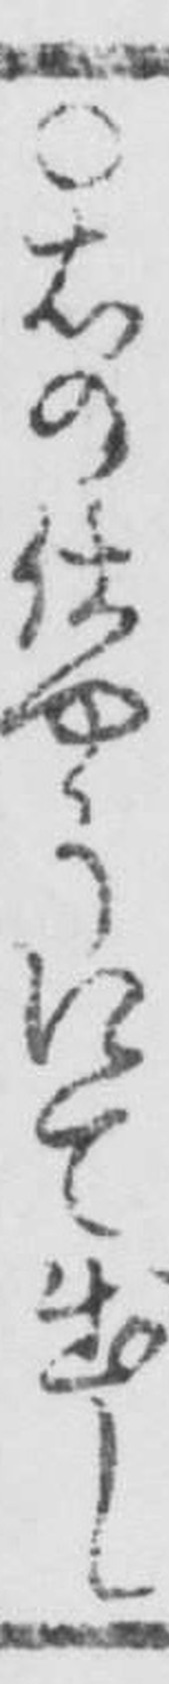○右のしやうにて出し
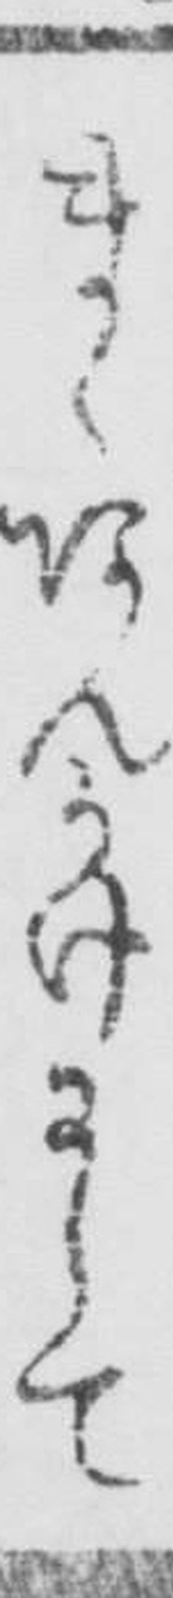まゝあんかけにして
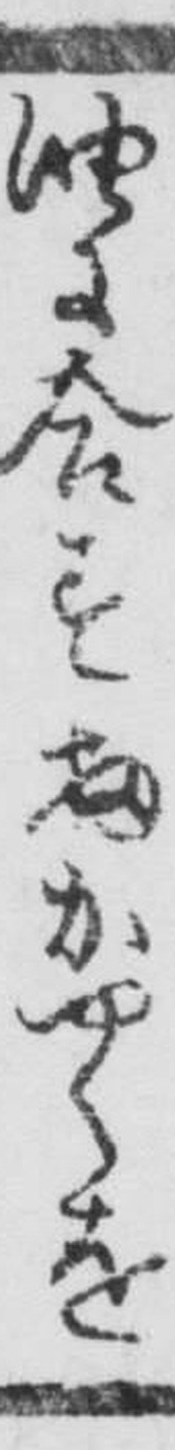油に合す扨かやくを
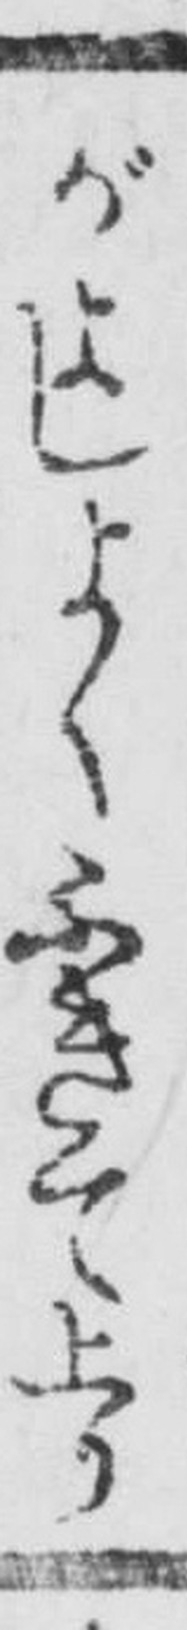がよしよくふきて上り
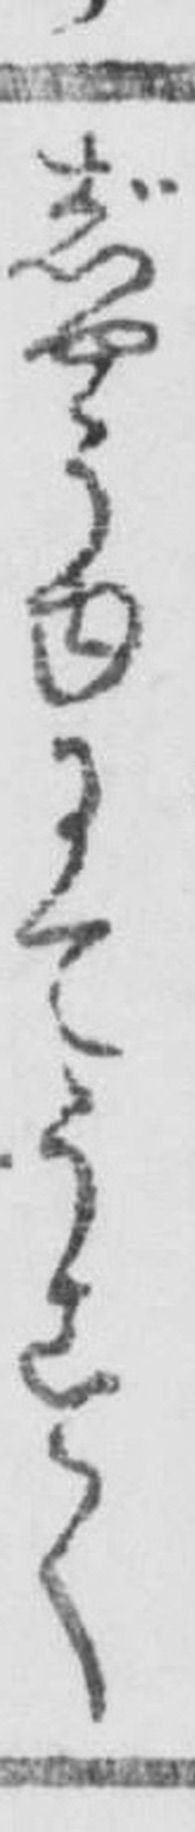じやうゆにてうすく
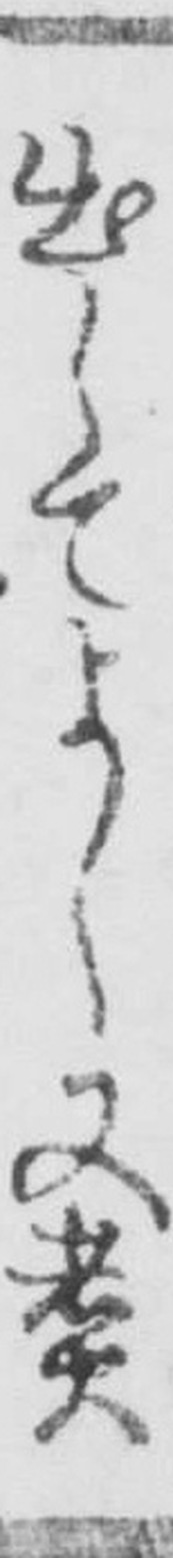出してよく又煮
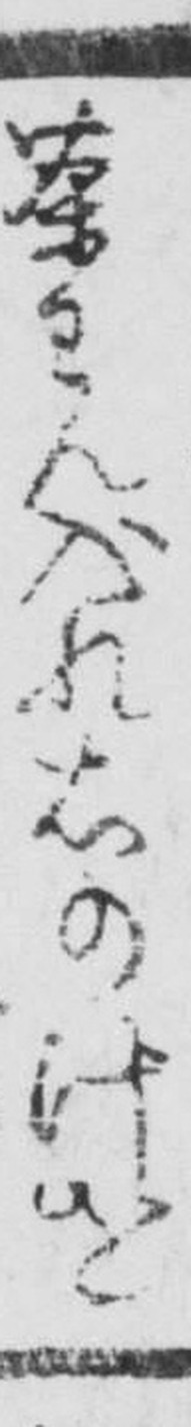茶わんへ入れ右の汁を
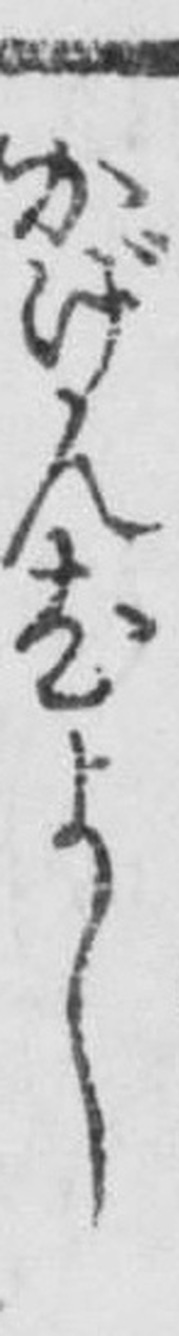かげん尤よし
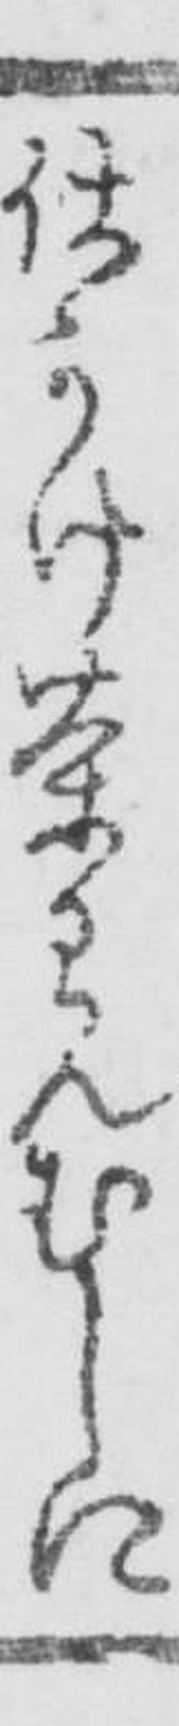仕かけ茶わんむしに
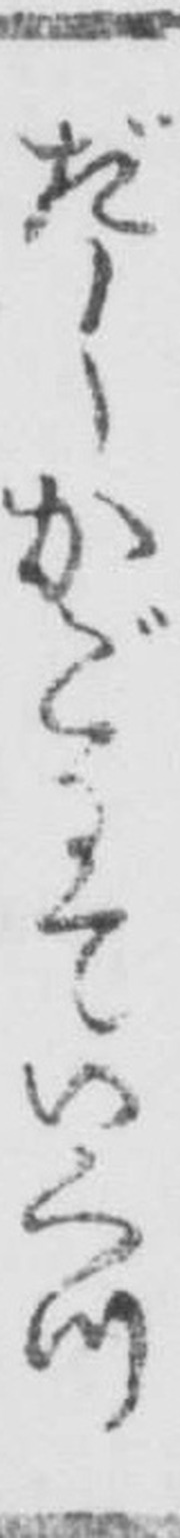だしかごにていくつ
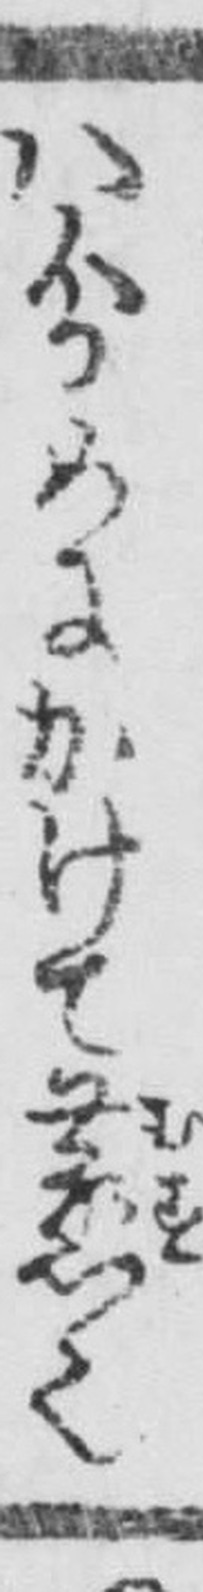八分めにかけて蒸也
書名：諸家通用/即席料理
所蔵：大阪府立大学学術情報センター 国文学研究資料館
